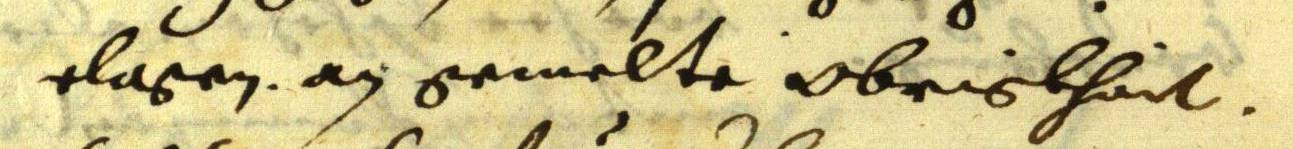clagen. an gemelte Obrigkhait.
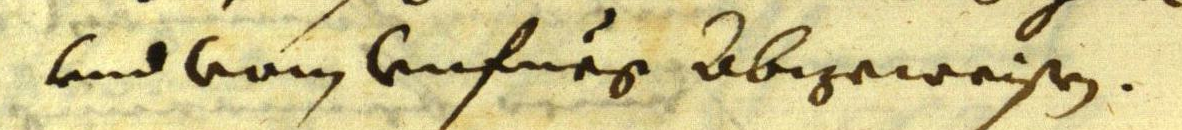vnd vom vnfūeg Abzeweisen.
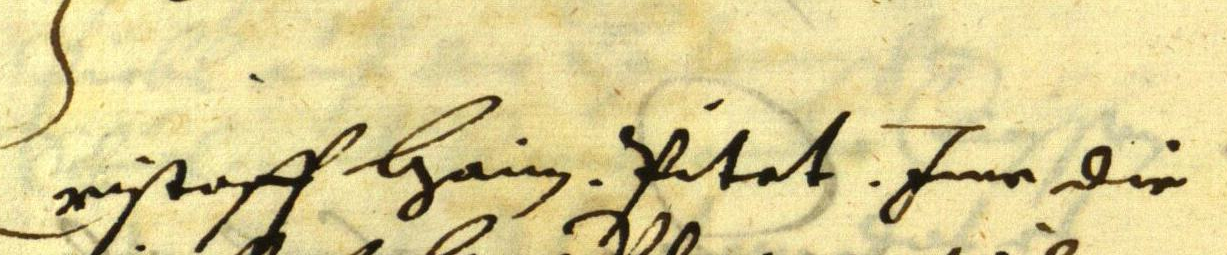Cristoff Haim. Pitet. Ime die
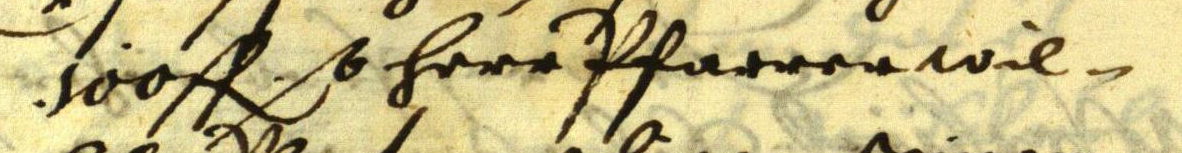.100 fl. so herr Pfarrer will¬
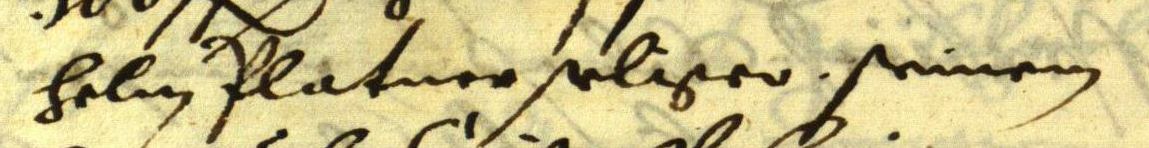helm Platner seliger. seinem
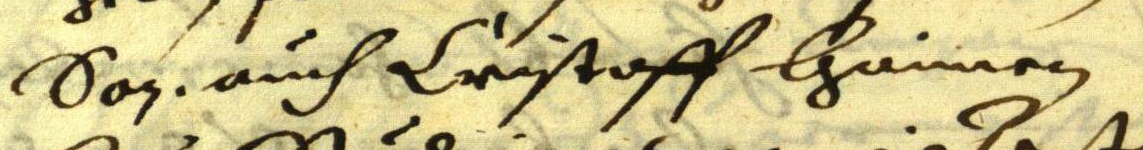Son. aūch Cristoff Haimen
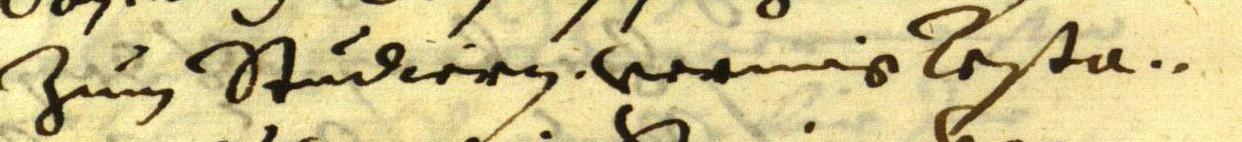Zūm Stūdiern. vermig Testa¬
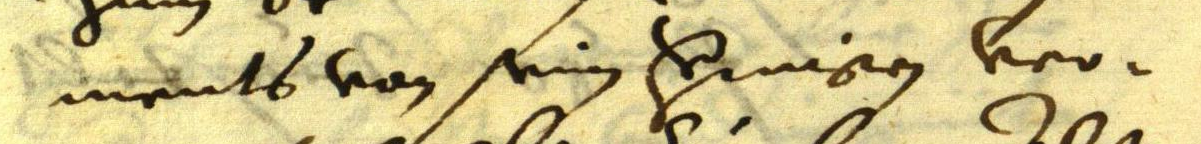ments von sein vmigen ver¬
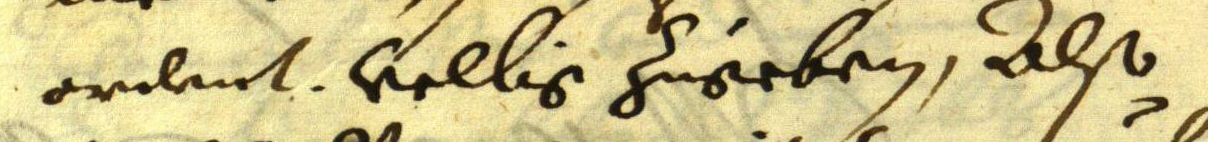ordnet. vellig Zūgeben, Also
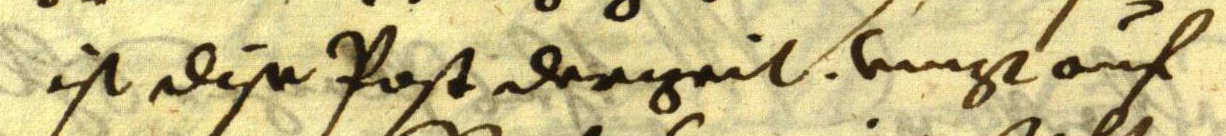ist dise Post derzeit. vnzt aūf
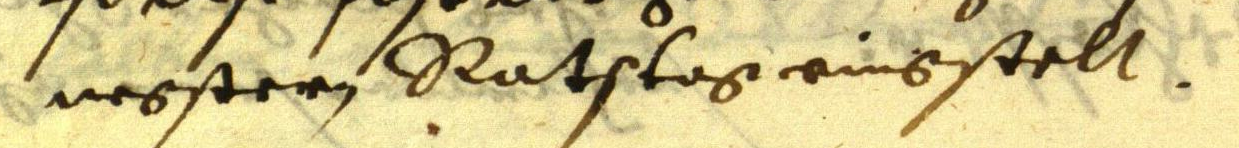negstern Ratstag eingstellt.
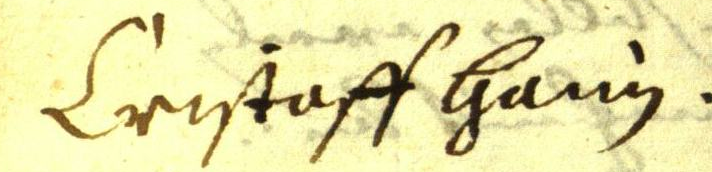Cristoff Haim.
